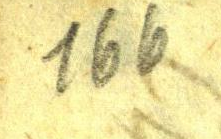166
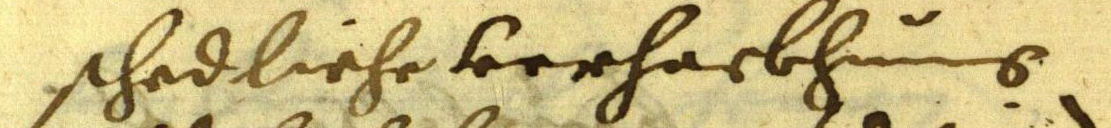schedliche verhackhūng
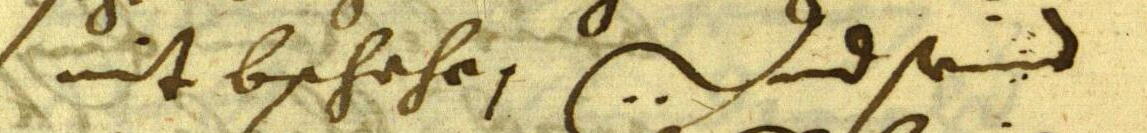nit bschehe, Vnd seind
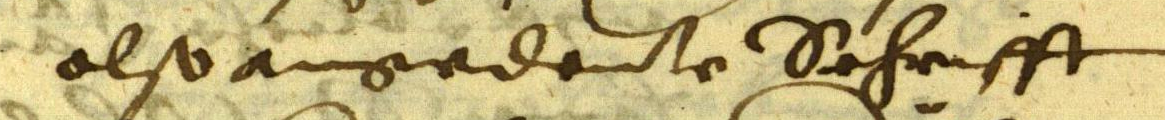also angedeüte Schrifft
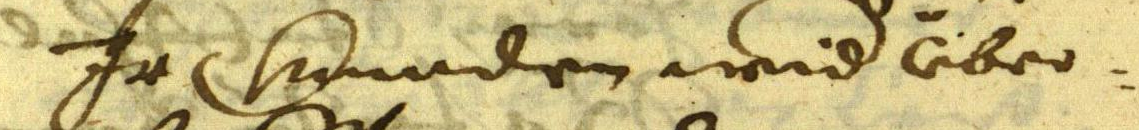Ir Gnaden wid v̄ber¬
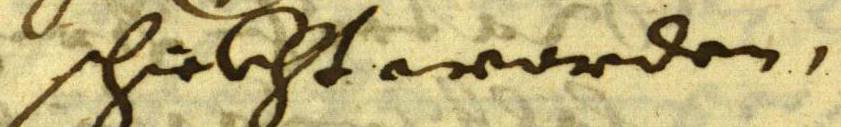schickht worden,
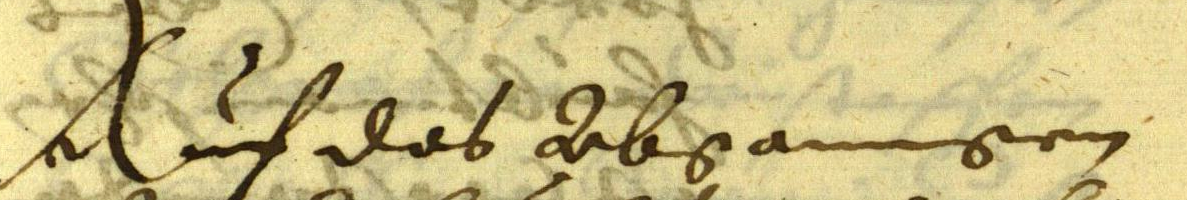Aūf das Abganngen
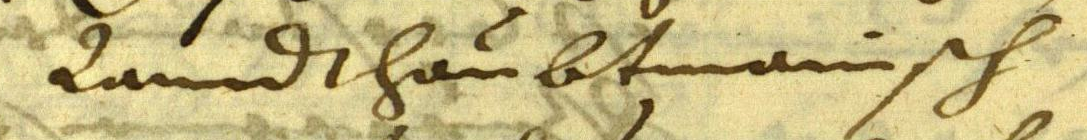Lanndthaūbtmanisch
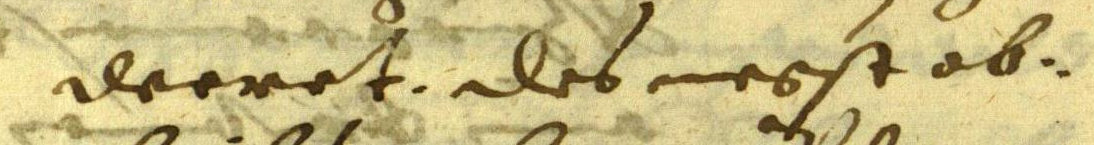decret. des negst ab¬
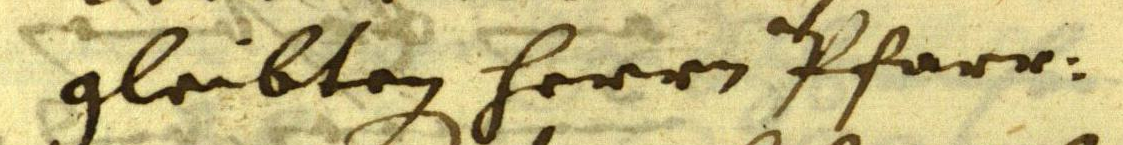gleibten herrn Pfarr¬
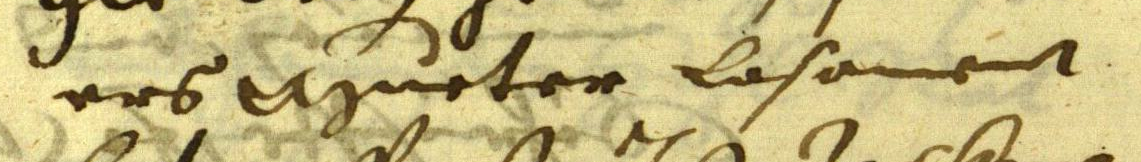ers Mūeter Losament
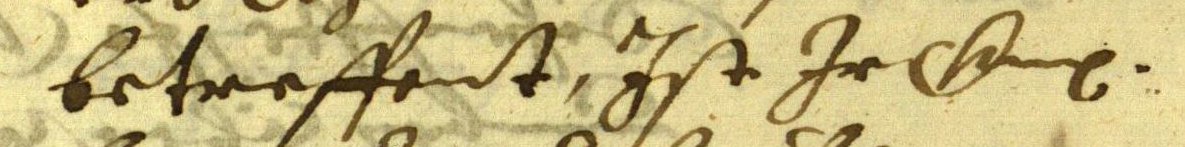betreffent, Ist Ir Gn.
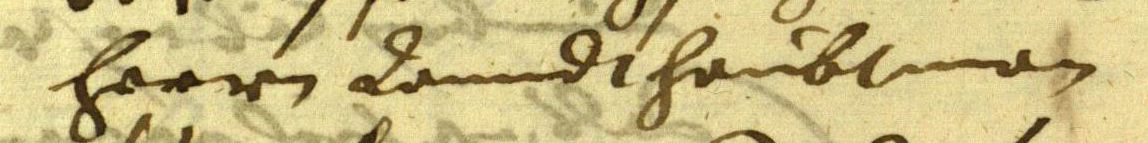herrn Lanndthaūbtman
